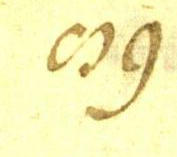89
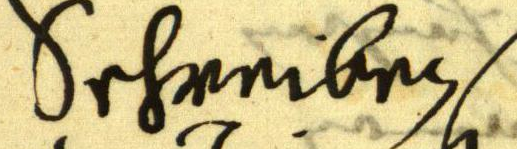Schreiben
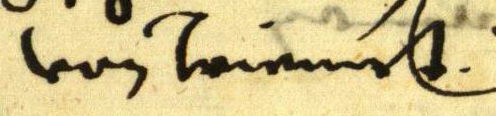von Triennt.
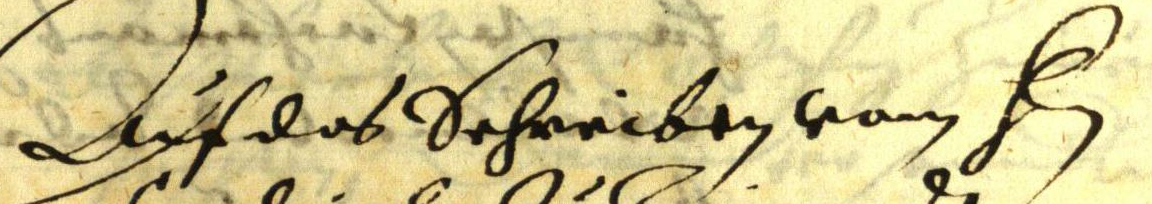Aūf das Schreiben vom hn
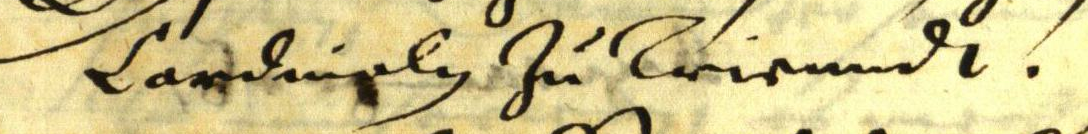Cardinaln Zū Trienndt.
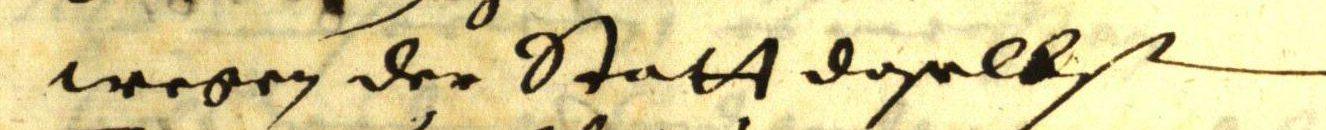wegen der Statt daselbst
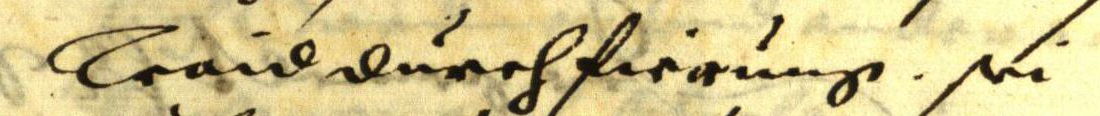Traid dūrchfierūng. sei
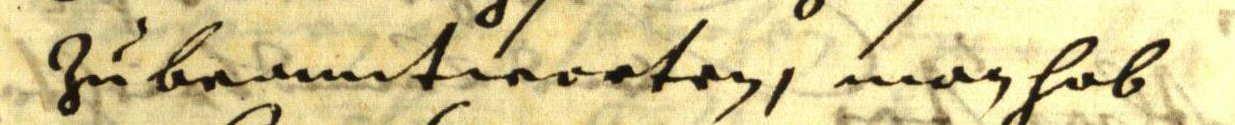Zū beanntworten, man hab
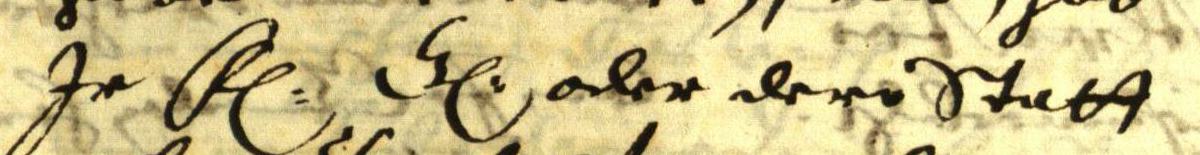Ir Fl: G: oder dero Statt
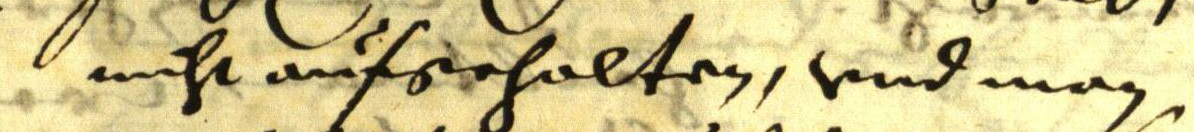nicht aūsgehalten, vnd man
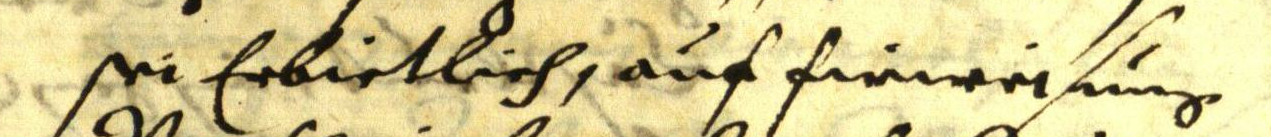sei Erbietlich, aūf firweisūng
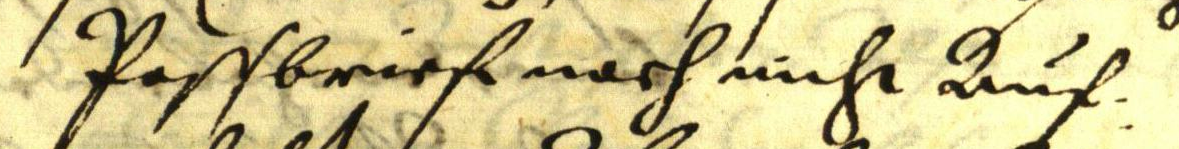Passbrief noch nicht Aūf¬
